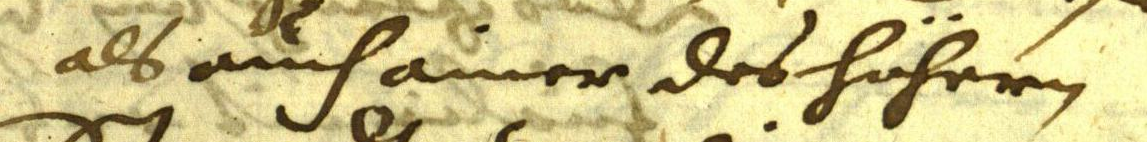als aūch ainer des höhern
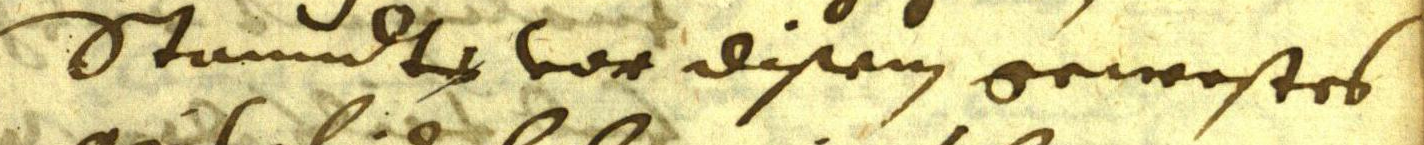Stanndts vor disem gewestes
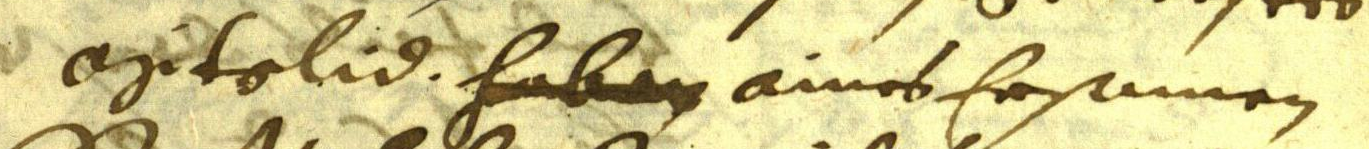Mitglid. haben aines Ersamen
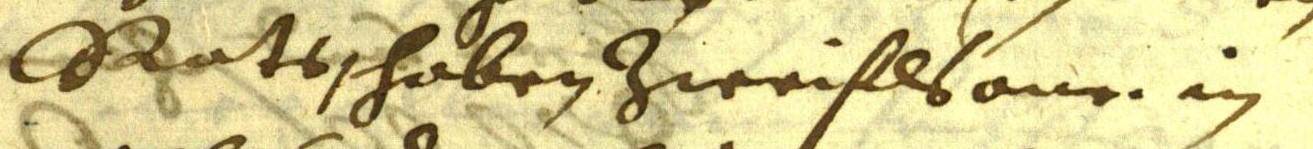Rats, haben Zweifels one. in
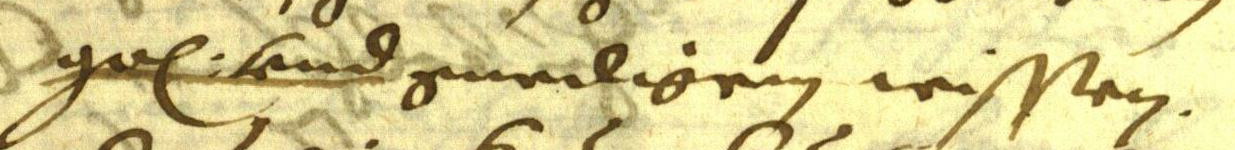go: vnd gnedigem wissen.
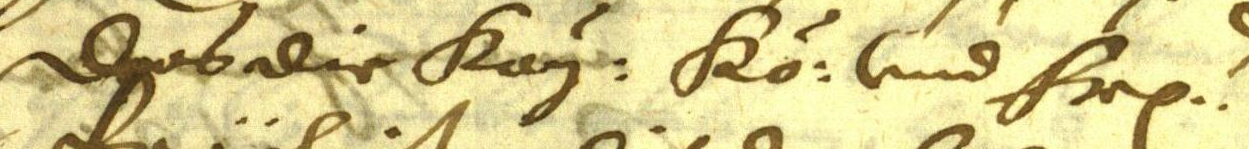das die Kaȳ: Kō: vnd Frl:
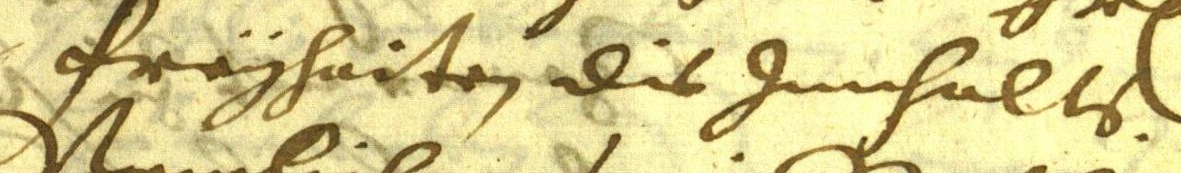Freÿhaiten dis Innhalts.
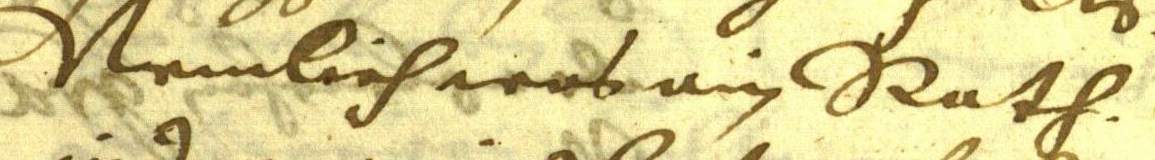Nemlich was ain Rath.
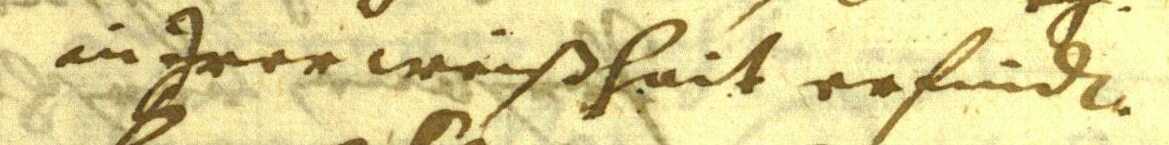in Irer weißhait erfindt.
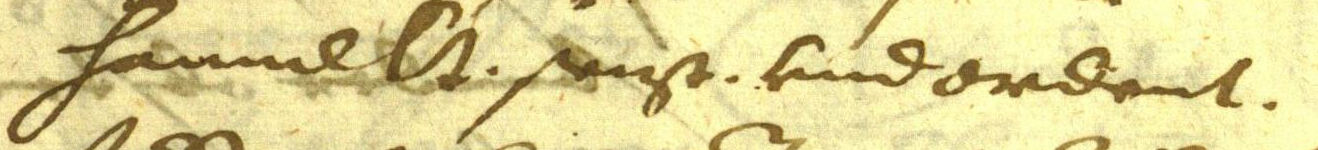hanndlt. sezt. vnd ordent.
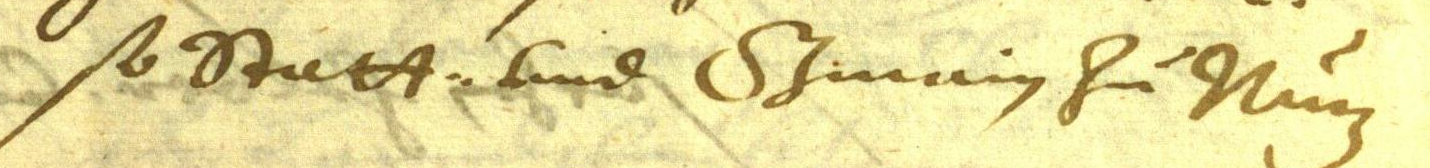so Statt: vnd Gmain Zū Nūz
